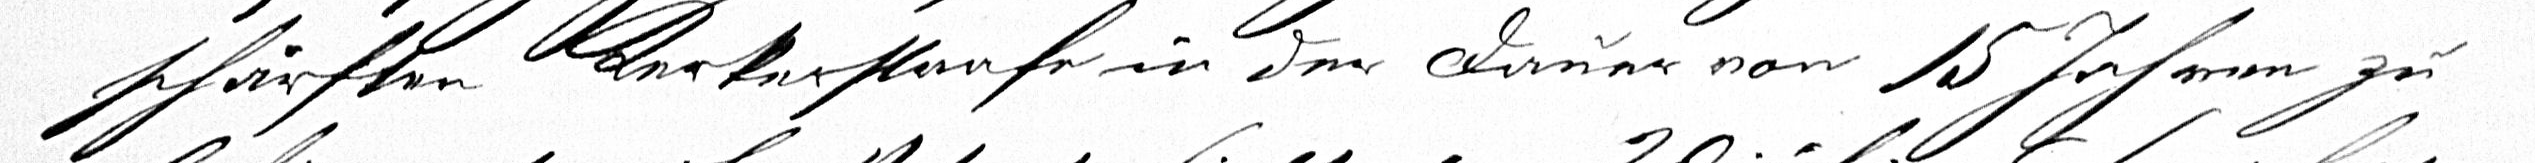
schärften Kerkerstrafe in der Dauer von 15 Jahren zu
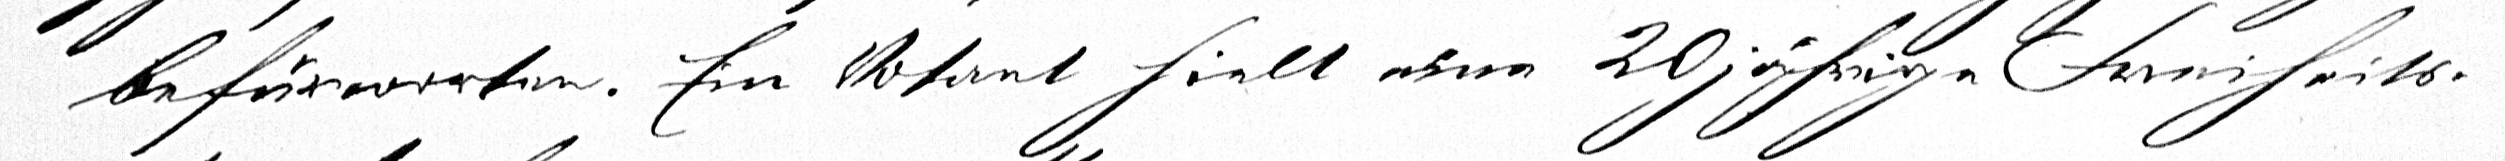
befürworten. Ein Volant hielt xx 20jährige Freiheits
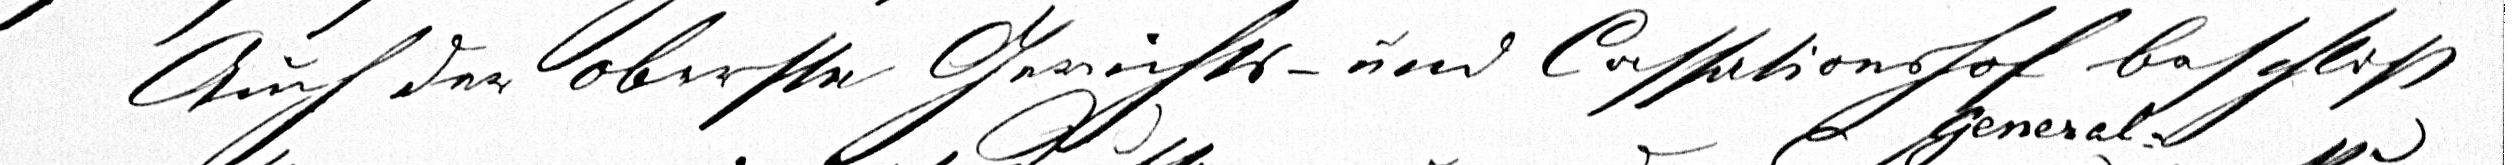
Auch der oberste Gerichts- und Cassationshof beschloß
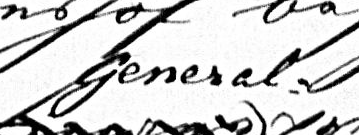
General
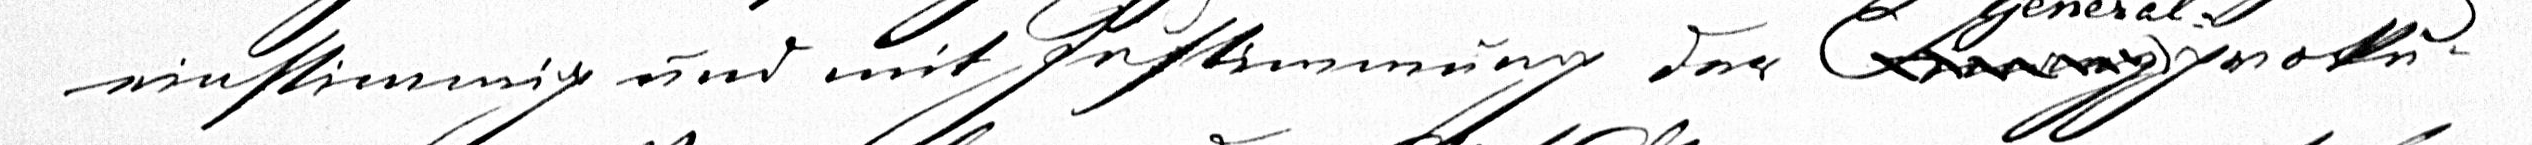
einstimmig und mit Zustimmung der proku¬
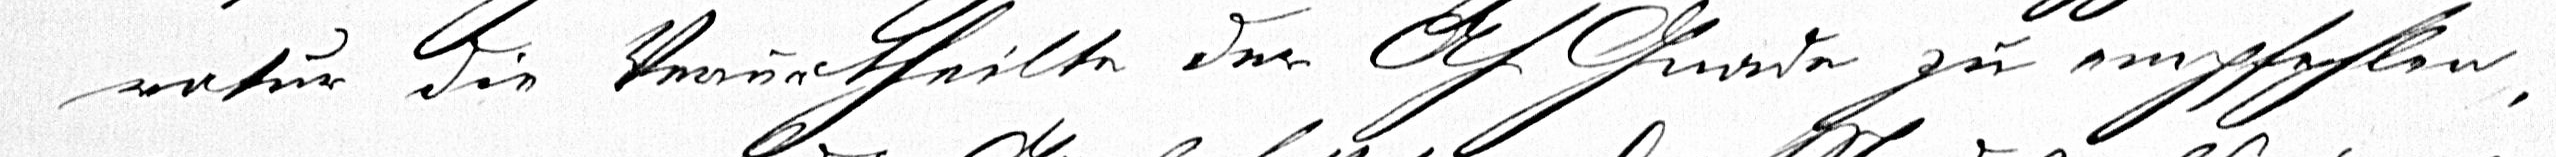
ratur die Verurtheilte der Af Gnade zu empfehlen,
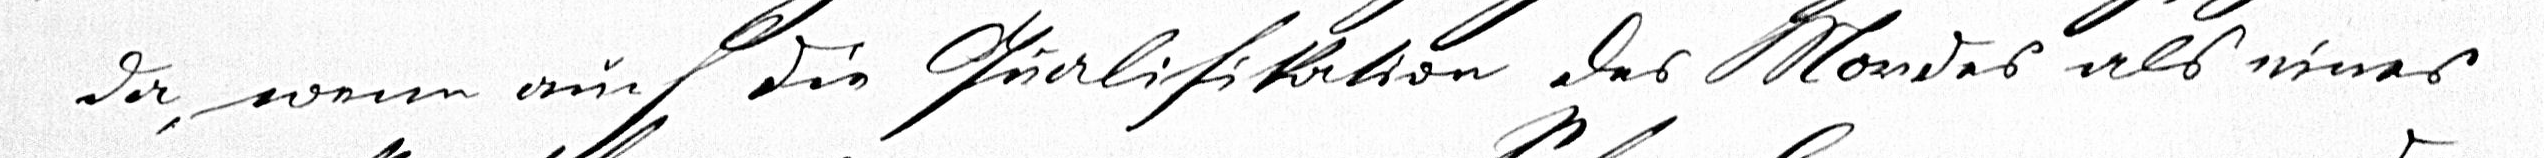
da wenn auch die Qualifikation des Mordes als eines
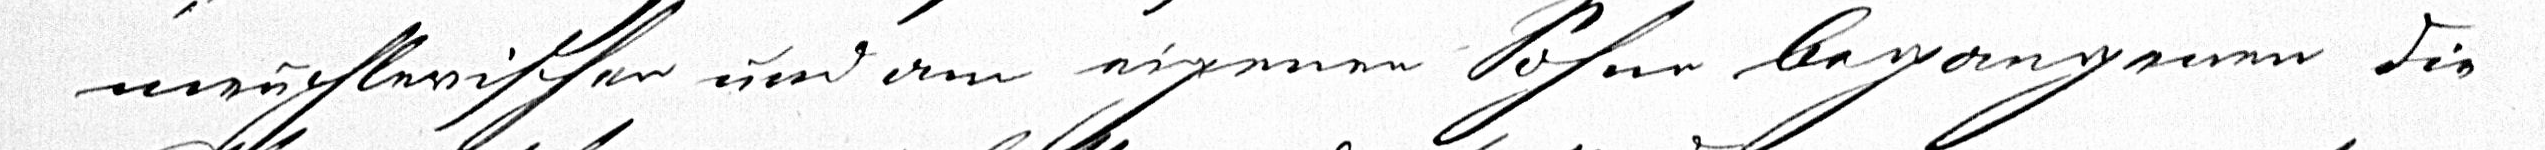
meuchlerischen und am eigenen Sohne begangenen die
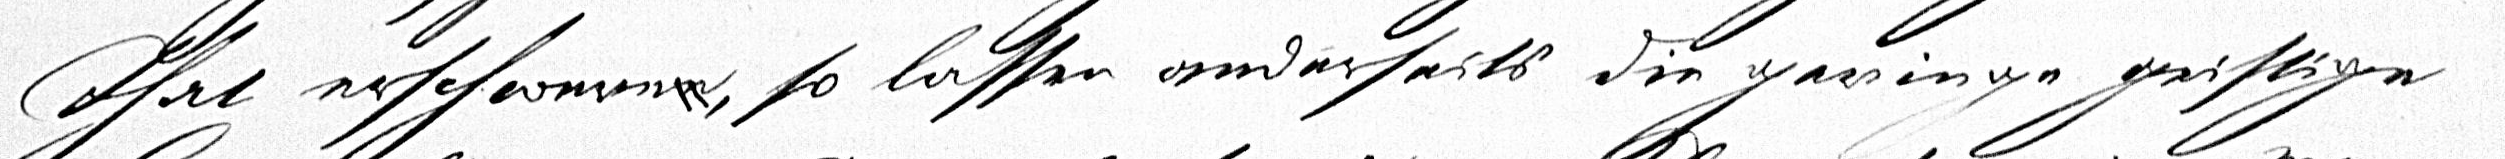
That erschwere, so lasser anderseits die geringe geistige
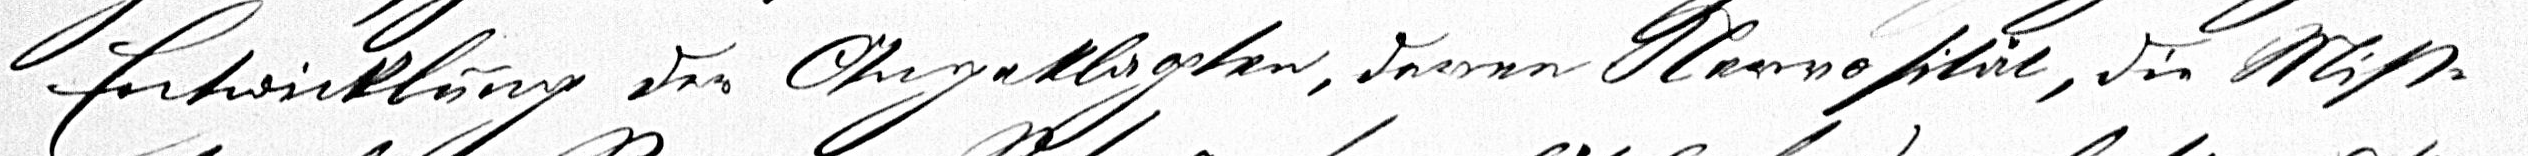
Entwicklung der Angeklagten, deren Nervosität, die Miß¬
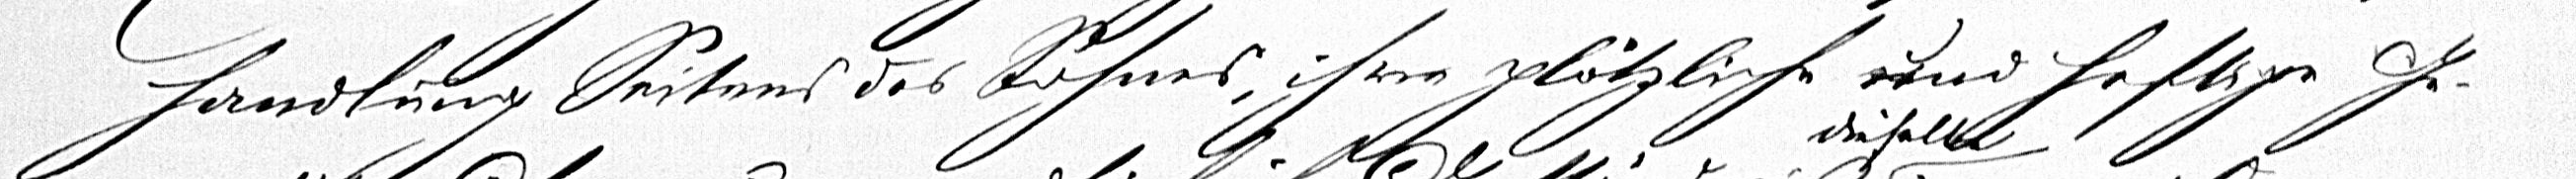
handlung Seitens des Sohnes, ihre plötzliche und heftige Ge¬
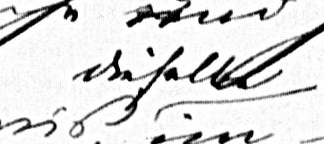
dieselbe
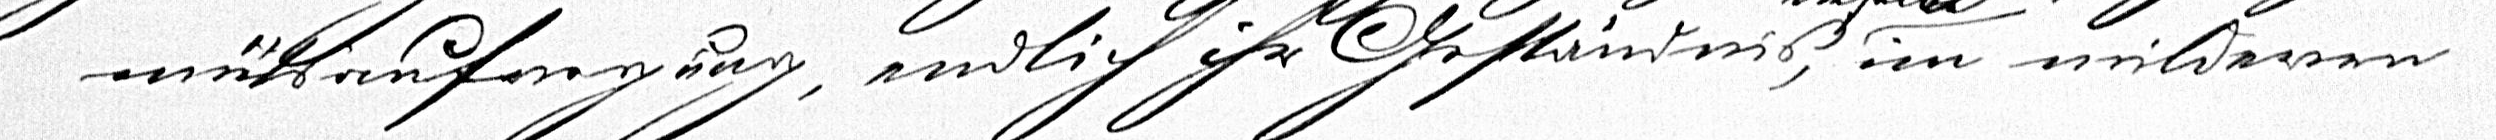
mütsraufregung, endlich ihr Geständnis, im milderen
